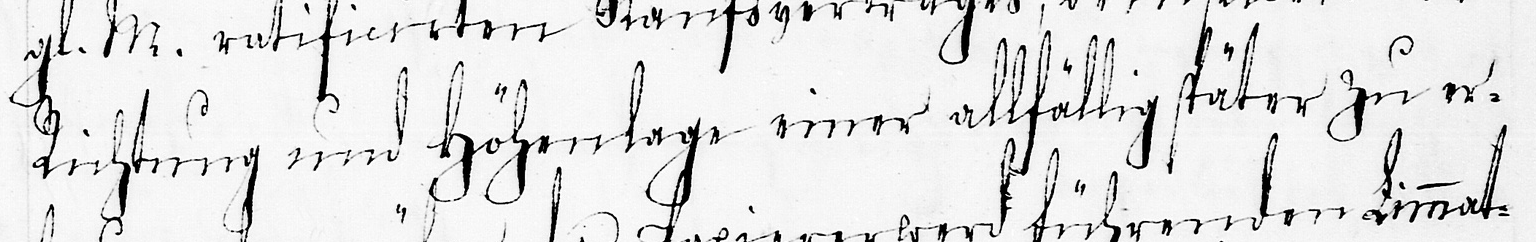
Richtung und Höhenlage einer allfällig später zu er¬
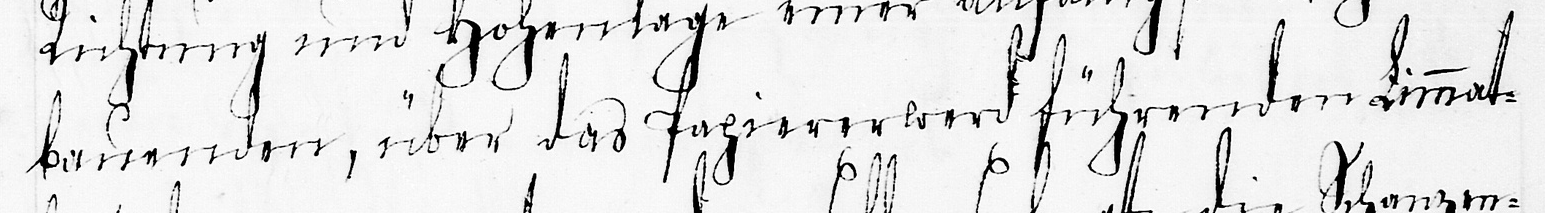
bauenden, über das Papiererwerd führenden Limmat¬
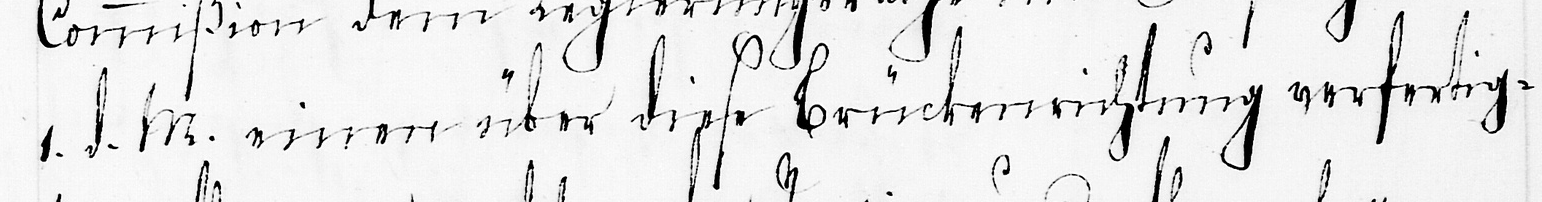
1. d. M. einen über diese Brückenrichtung verfertig¬
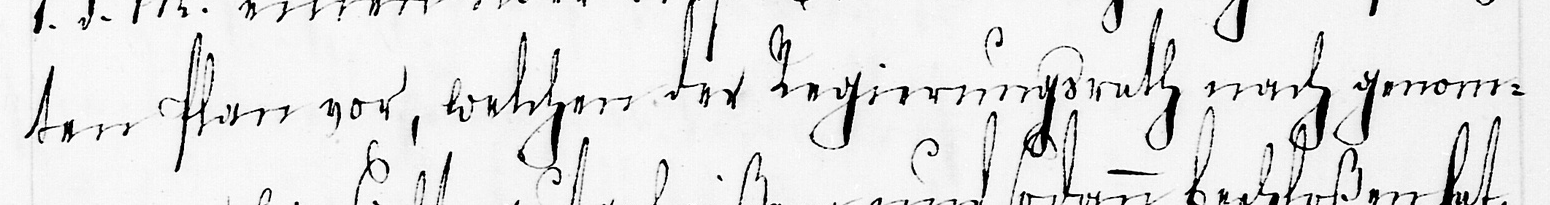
ten Plan vor, welchen der Regierungsrath nach genom¬
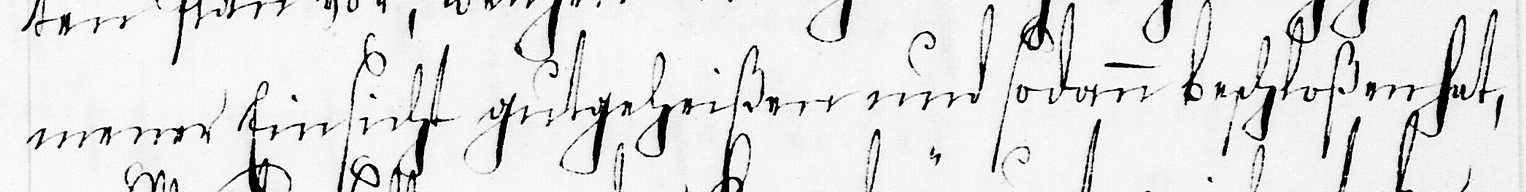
mener Einsicht gutgeheißen und sodann beschloßen hat,
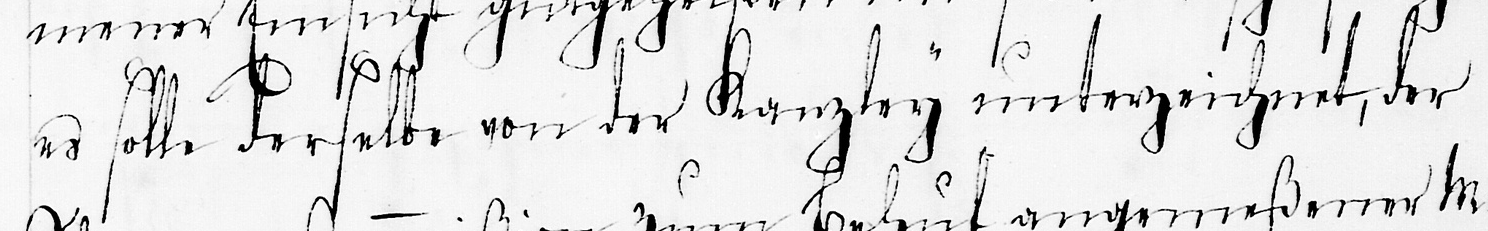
es solle derselbe von der Kanzley unterzeichnet, der
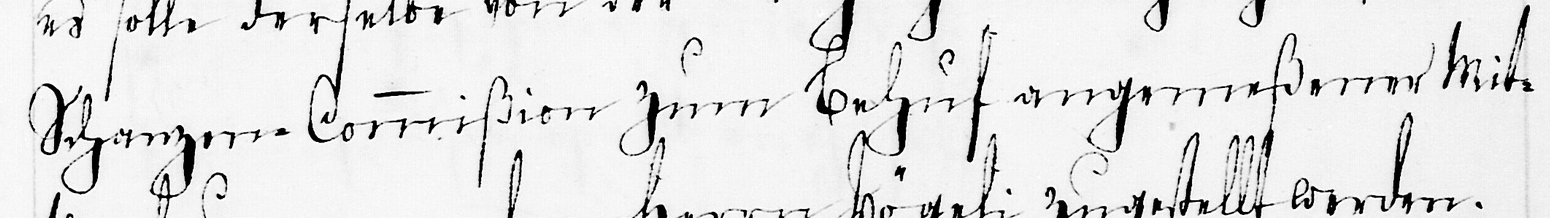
Schanzen-Commißion zum Behuf angemeßener Mit¬
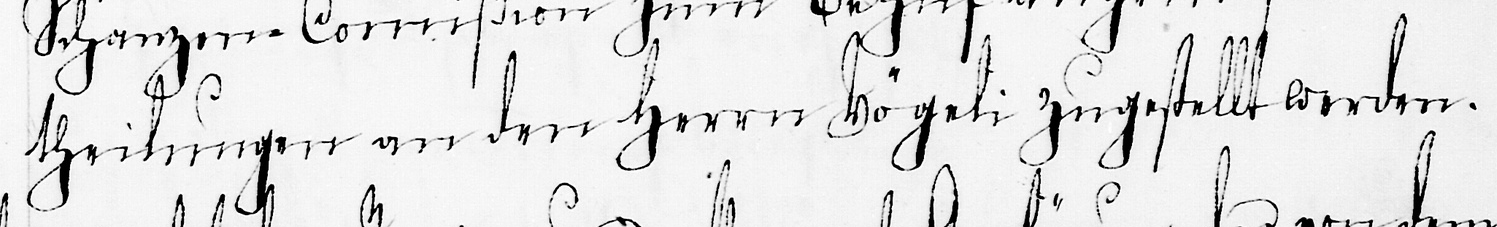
theilungen an den Herrn Vögeli zugestellt werden.
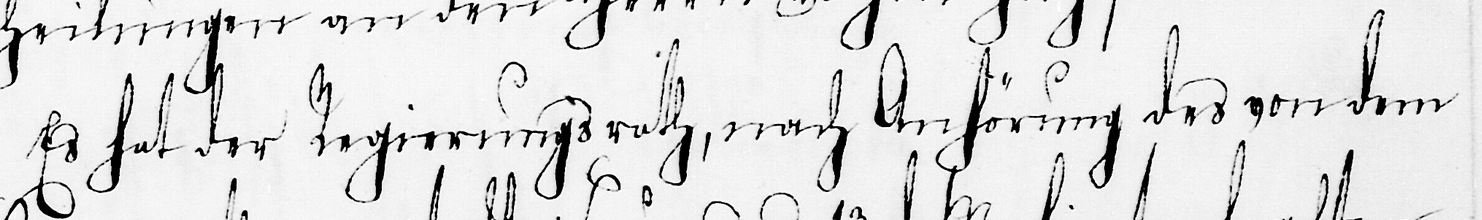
Es hat der Regierungsrath, nach Anhörung des von dem
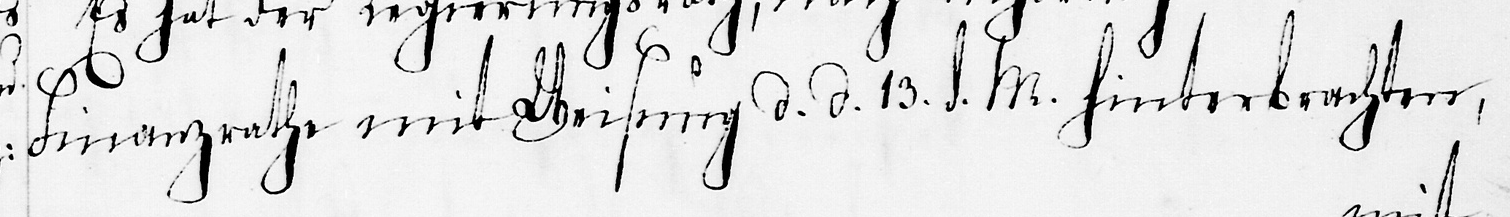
Finanzrathe mit Weisung d. d. 13. d. M. hinterbrachten,
